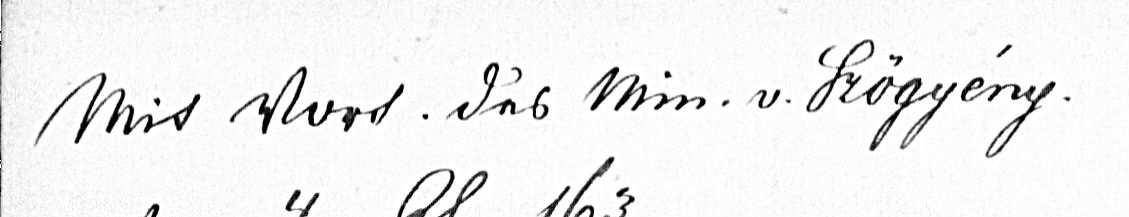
Mit Vort. des Min. von Szögény
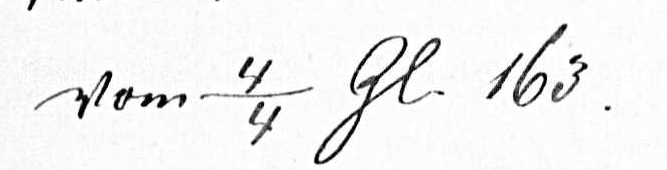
vom 4/4 Zl. 163
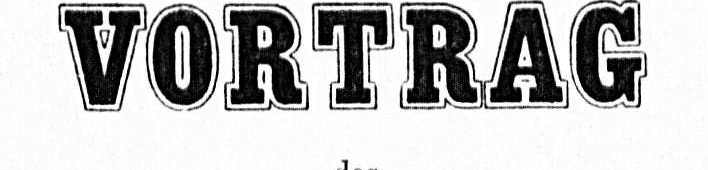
Vortrag
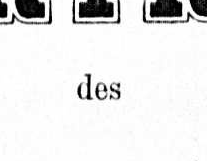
Des
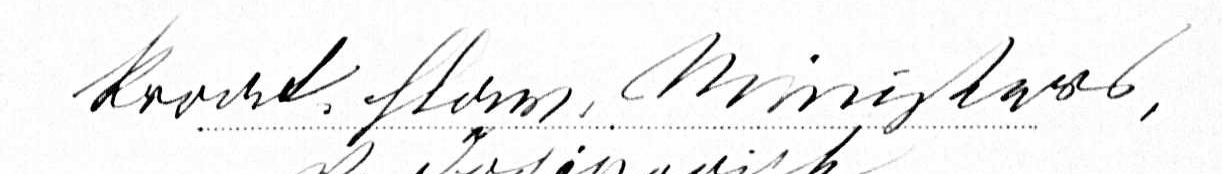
kroat. slaw. Ministers
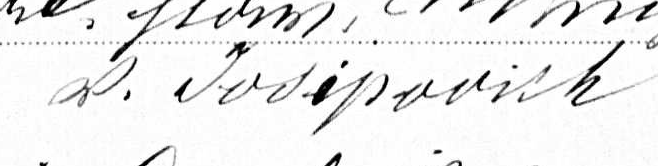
v. Josipovich
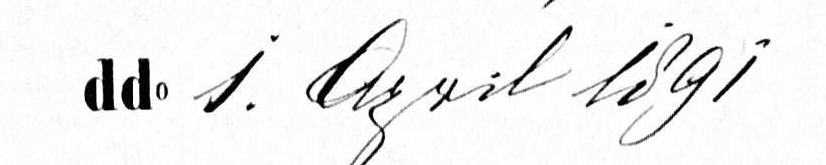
Ddo 1 April 1891
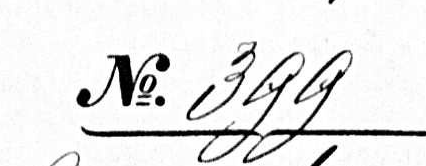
No 399
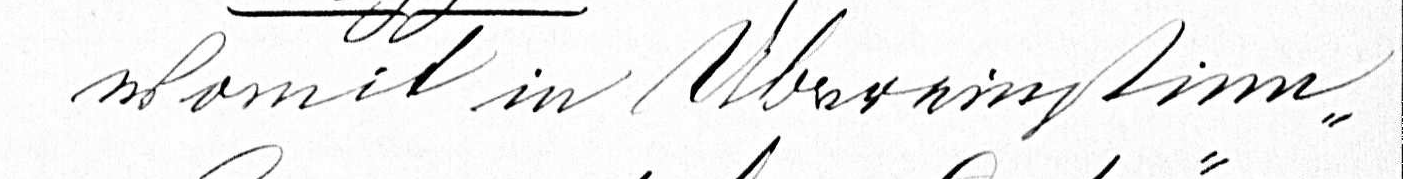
womit in Übereinstim¬
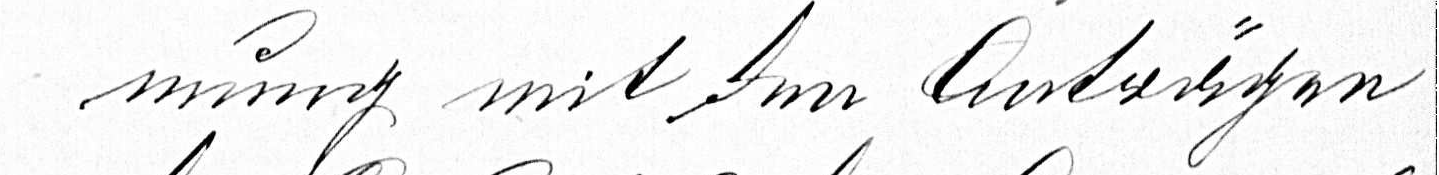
mung mit den Anträgen
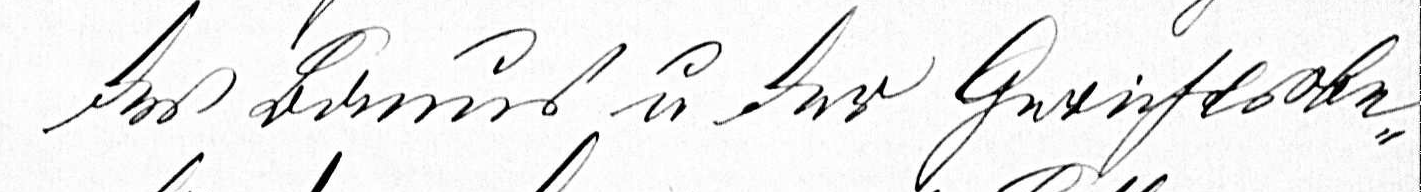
des Banus u. der Gerichtsbe¬
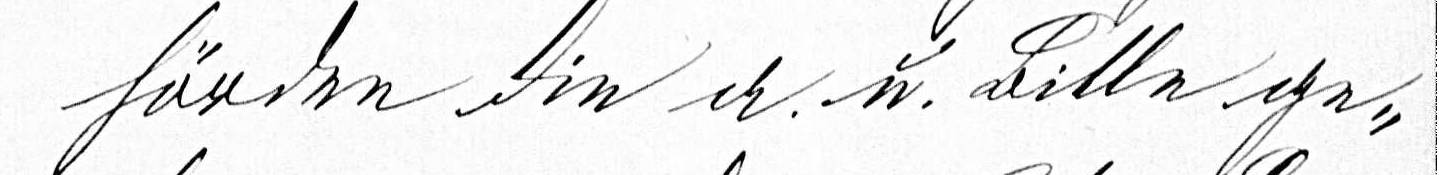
hörden die a. u. Bitte ge¬
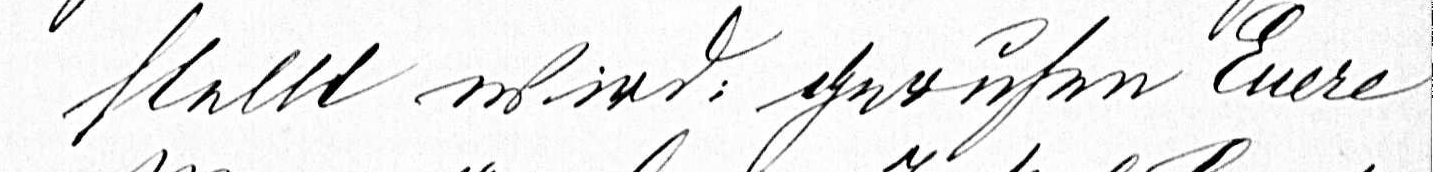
stellt wird: geruhen Euere
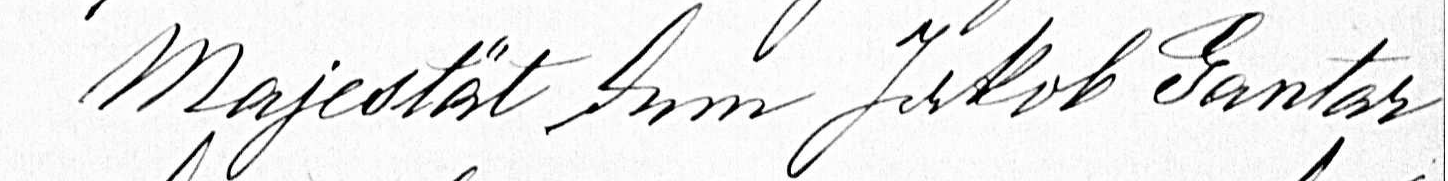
Majestät dem Jakob Gantar
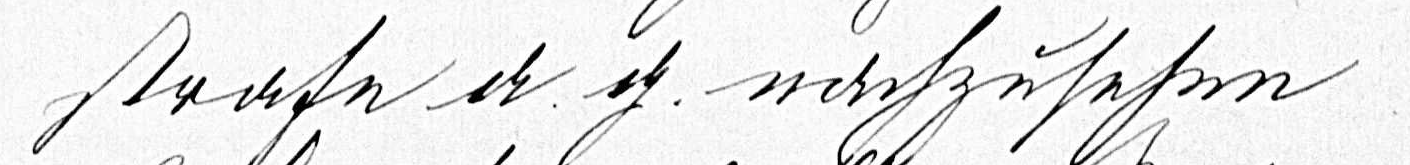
strafe a.g. nachzusehen
